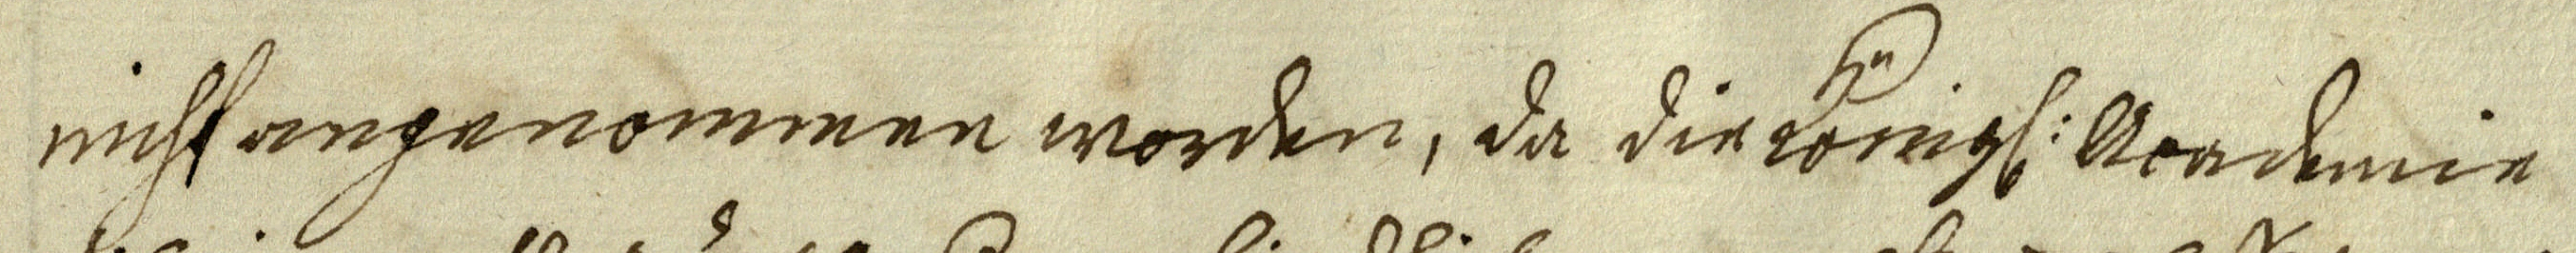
nicht angenommen worden, da die Königl. Academie
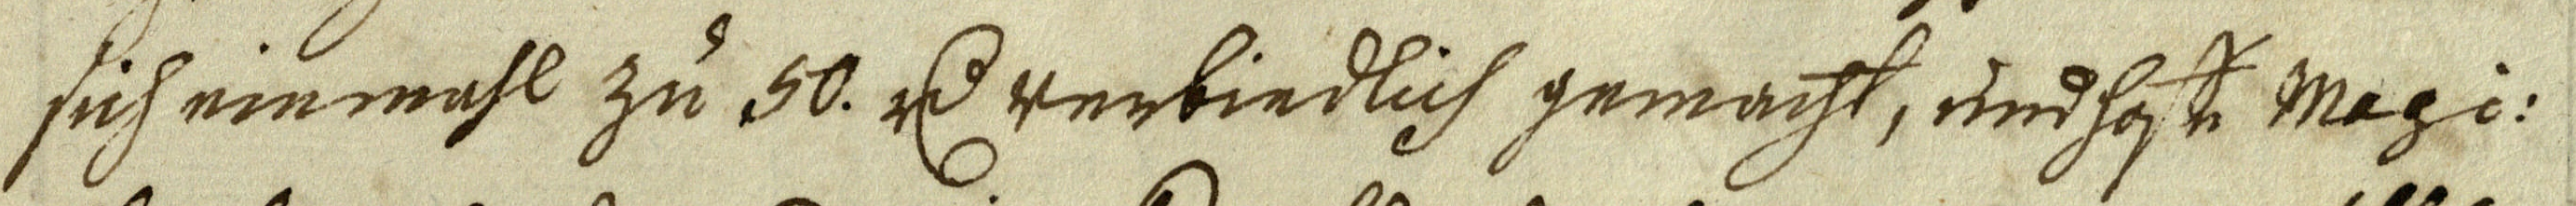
sich einmahl zu 50. r. verbindlich gemacht, und hoffe Magi¬
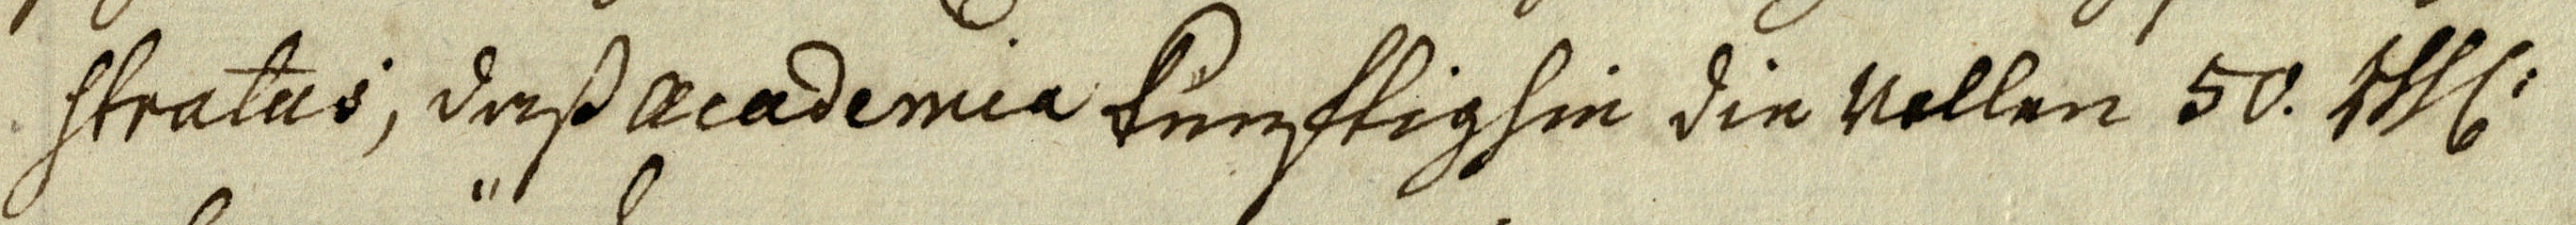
stratus, daß Academia künftighin die vollen 50. R.
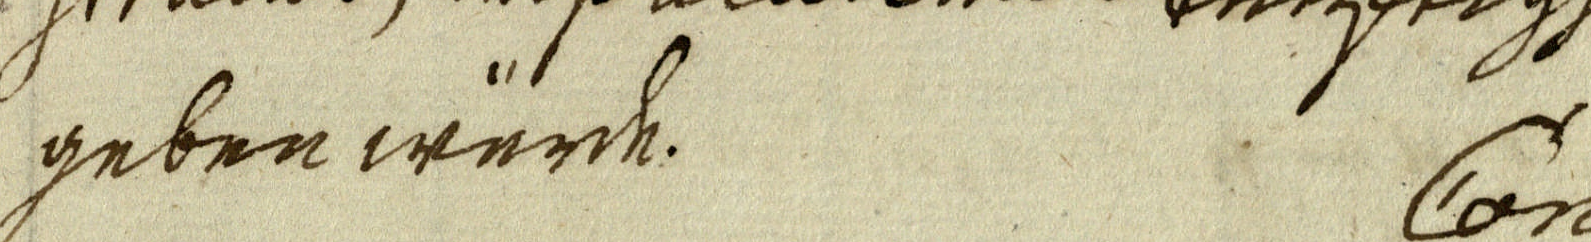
geben würde.
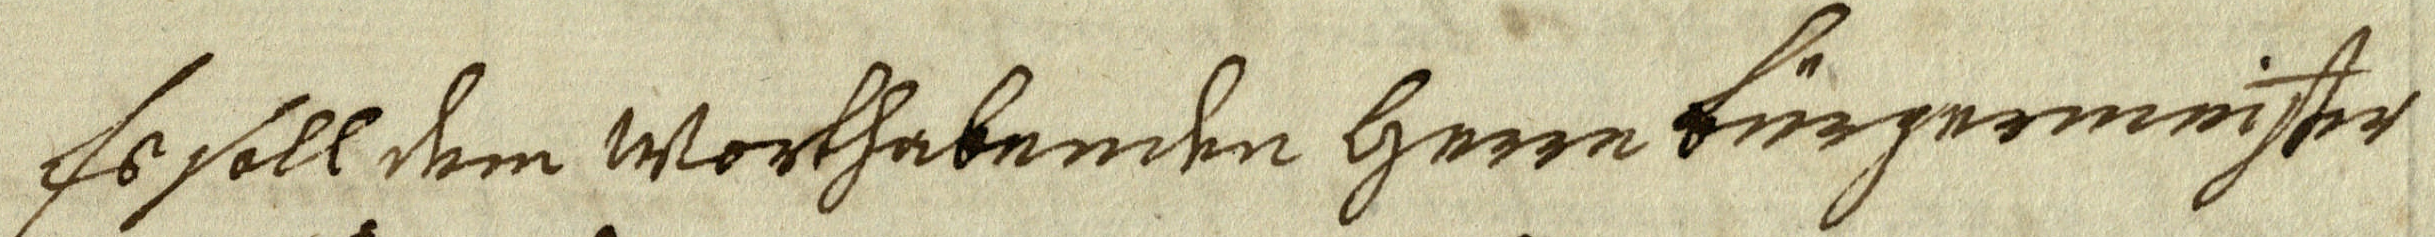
Es soll dem worthabenden Herrn Bürgermeister
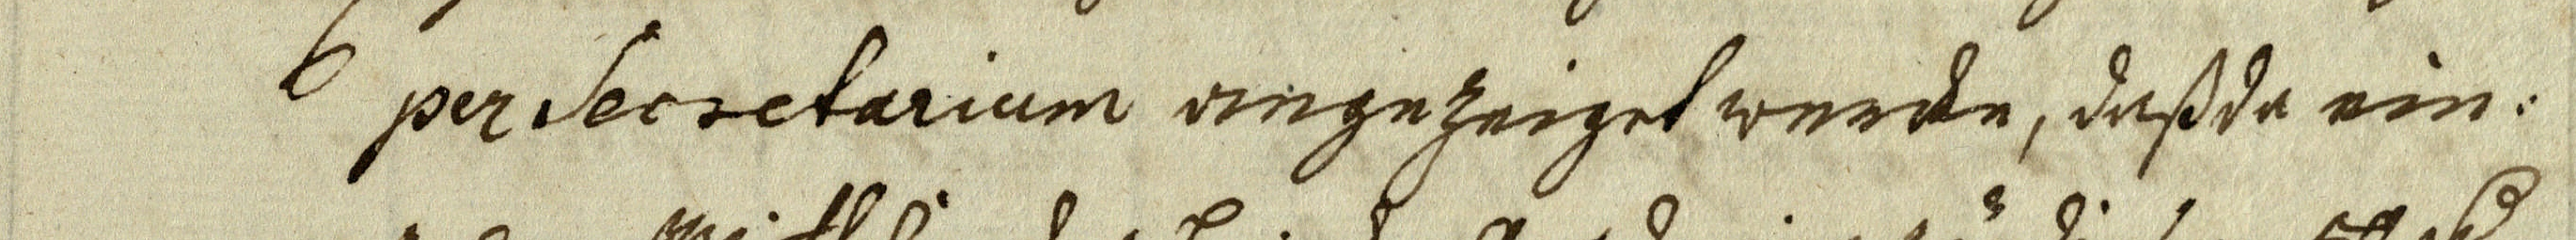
per Secretarium angezeiget werden, daß da ein¬
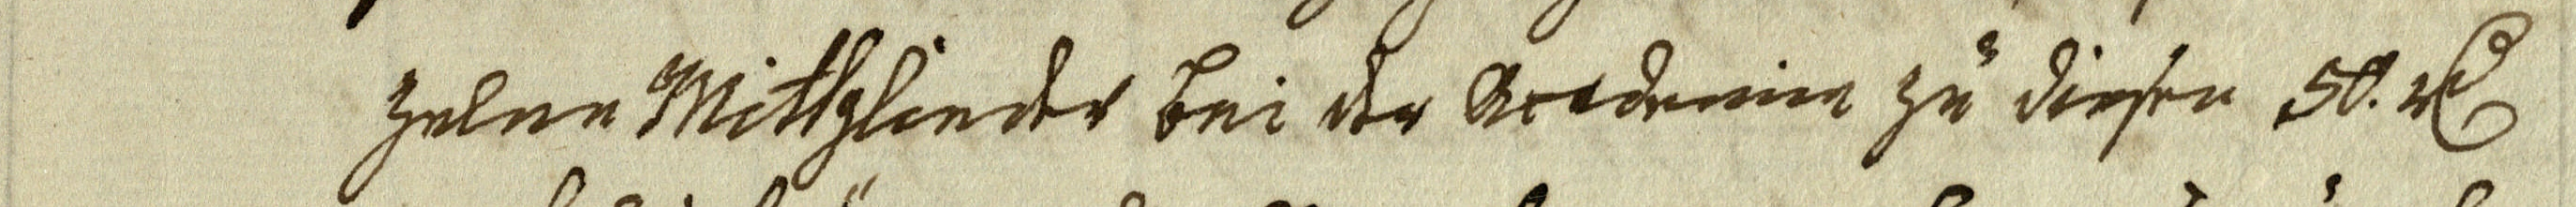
zelne Mittglieder bei der Academie zu diesen 50. r.
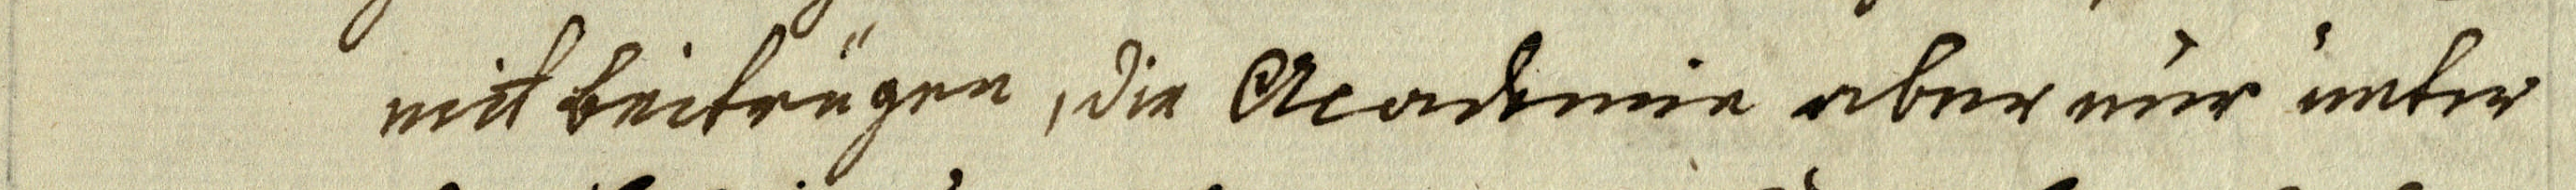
mit beitrügen, die Academie aber nur unter
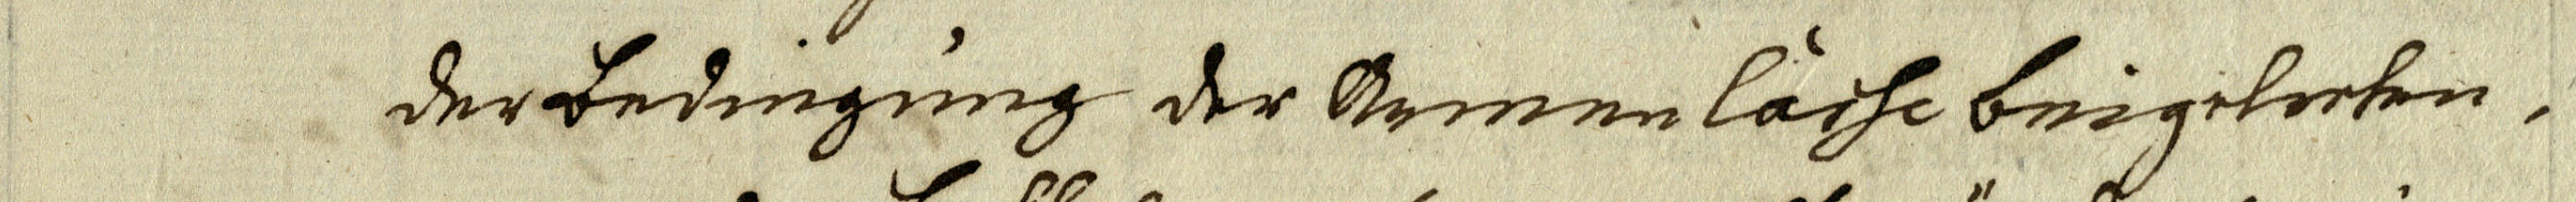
der Bedingung der ArmenCasse beigetreten,
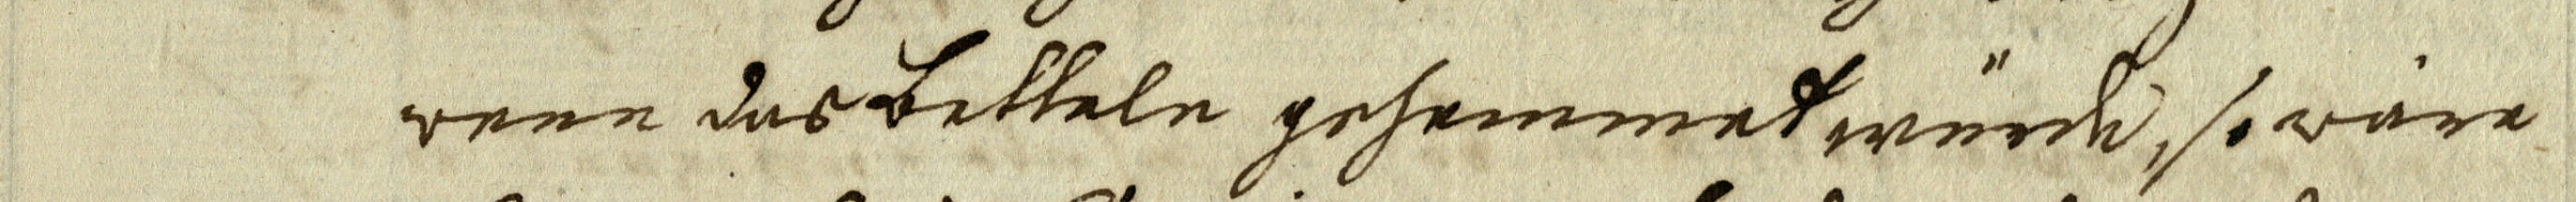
wenn das Betteln gehemmet würde, so wäre
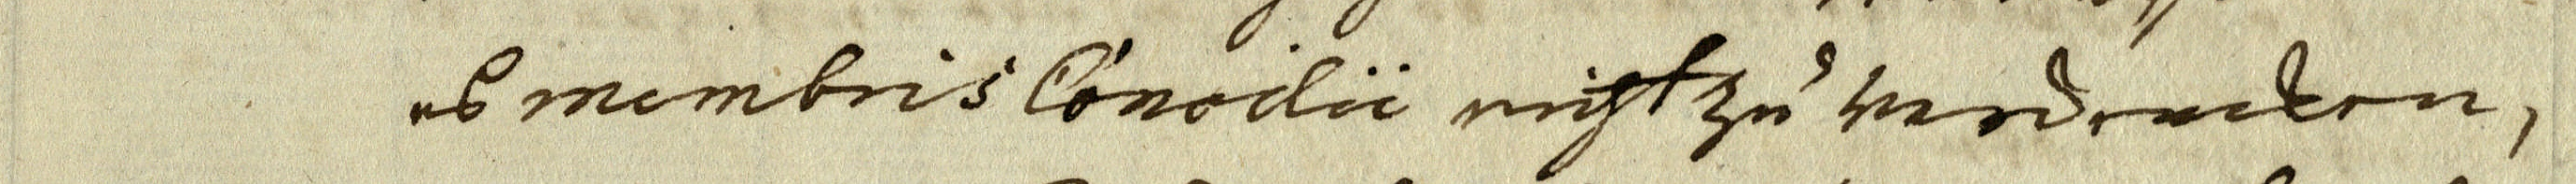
es membris Concilii nicht zu verdencken,
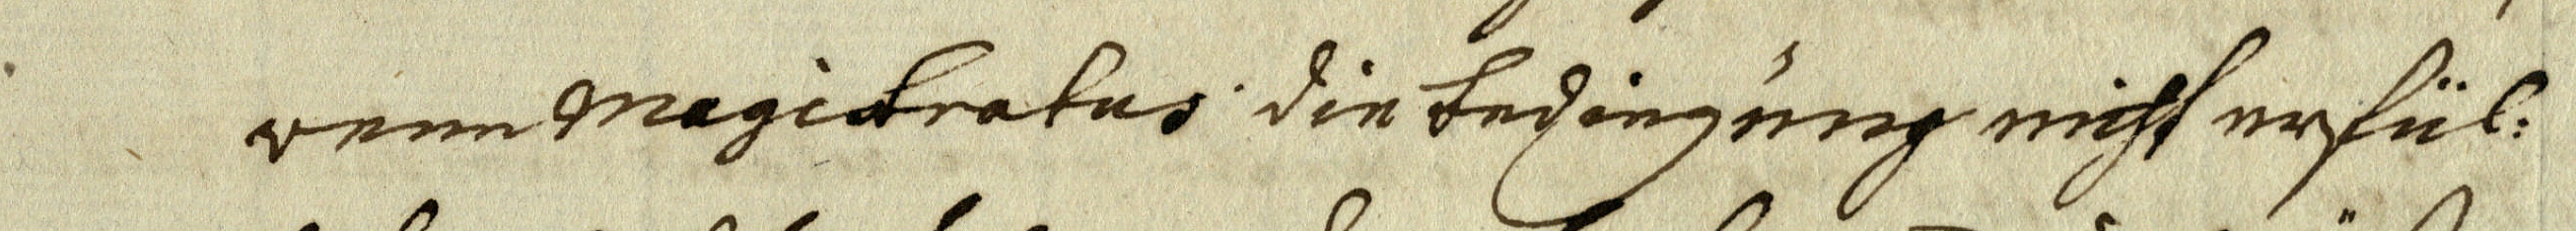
wenn Magistratus die Bedingung nicht erfül¬
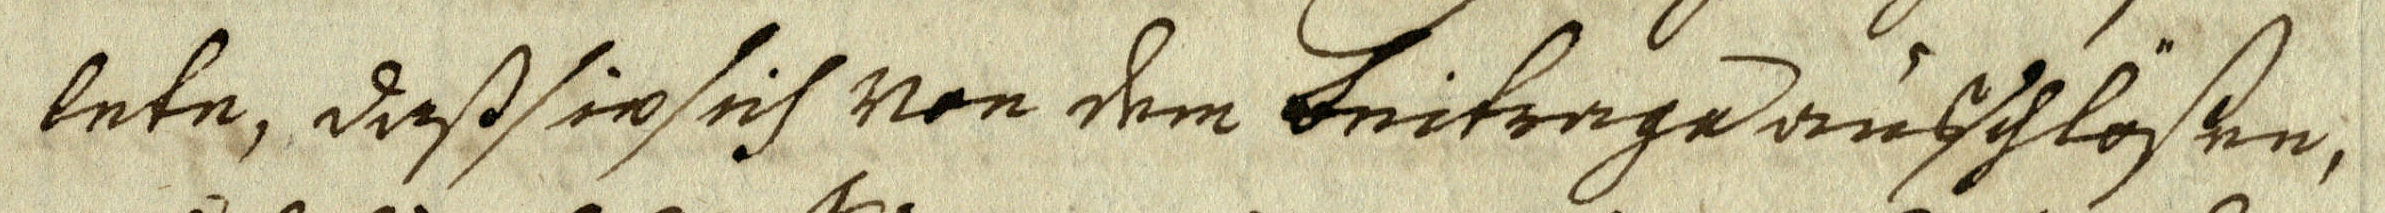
lete, daß sie sich von dem Beitrage ausschlößen,
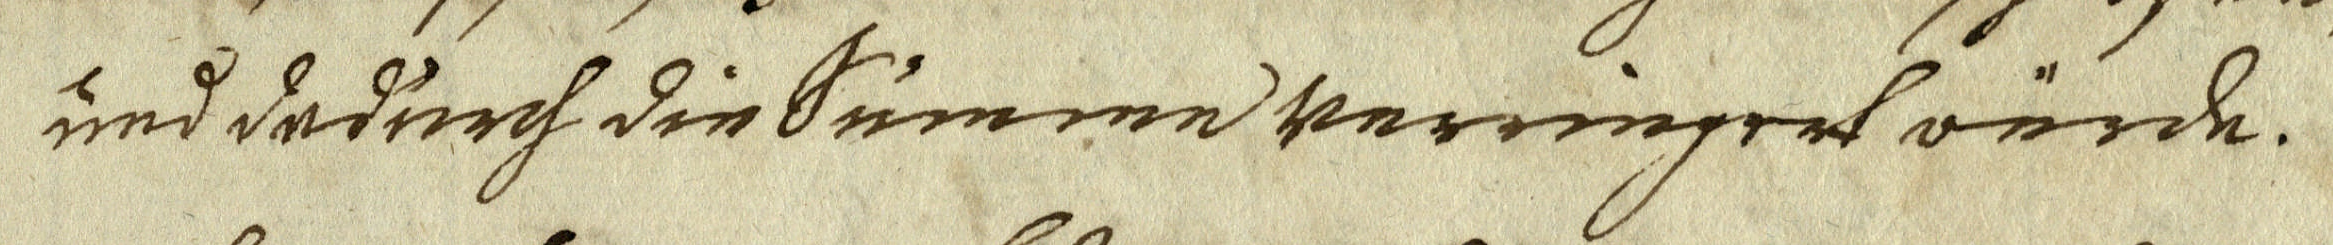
und dadurch die Summe verringert würde.
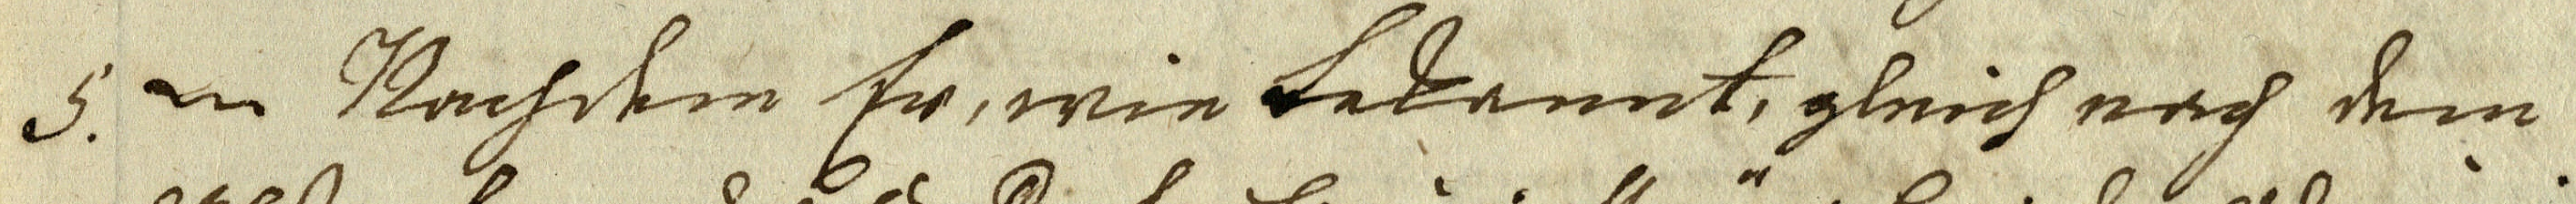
5. Nachdem Er, wie bekannt, gleich nach dem
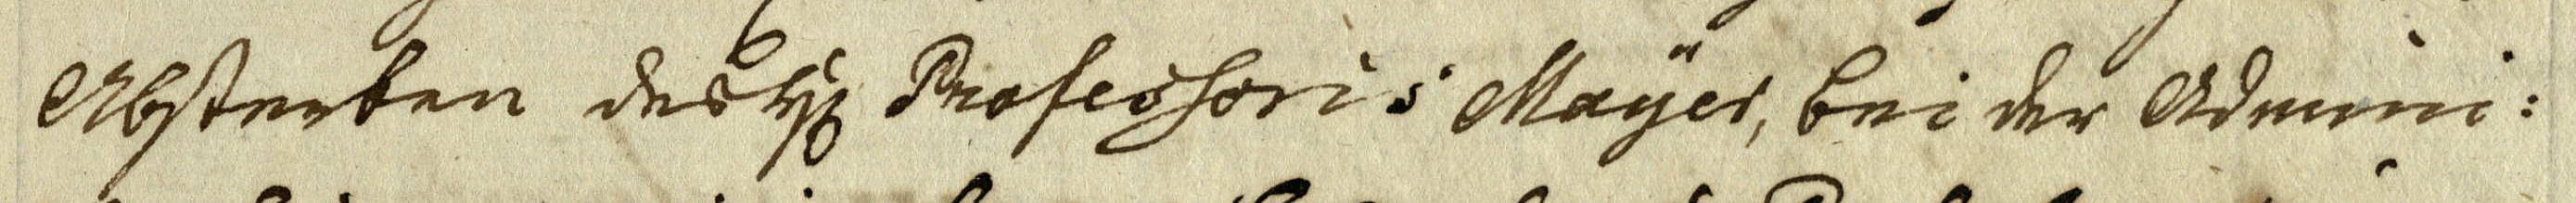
Absterben des H. Professoris Maÿer, bei der Admini¬
